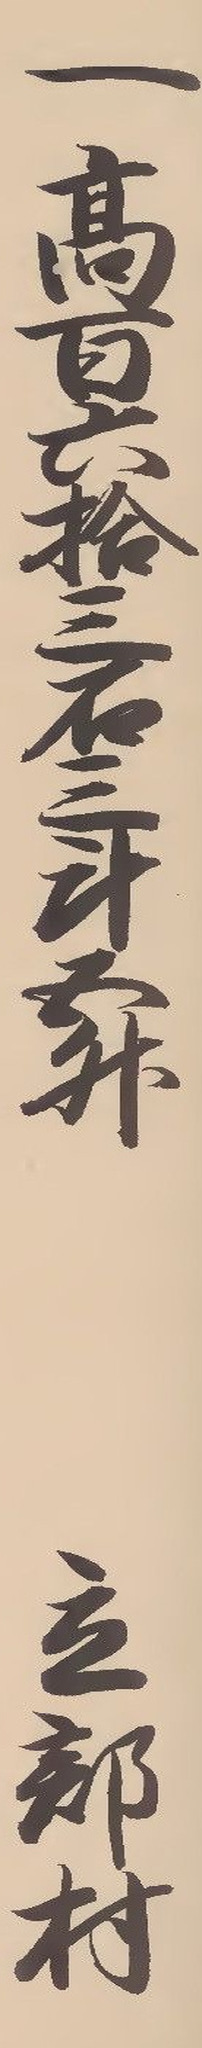一高百六拾三石三斗五升立部村
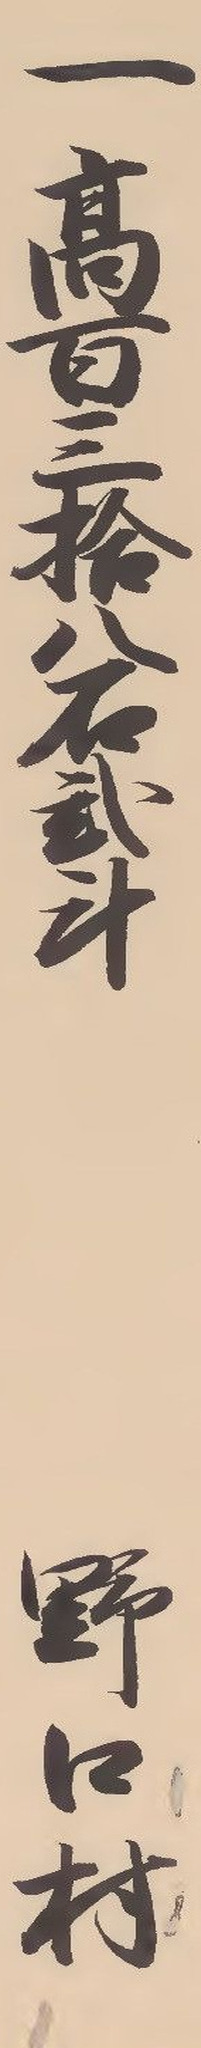一高百三拾八石弐斗野口村
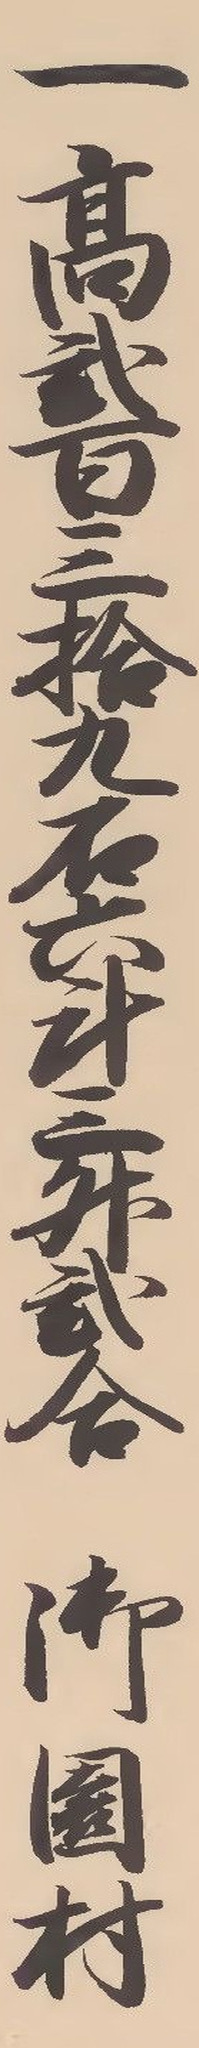一高弐百三拾九石六斗三升弐合御園村
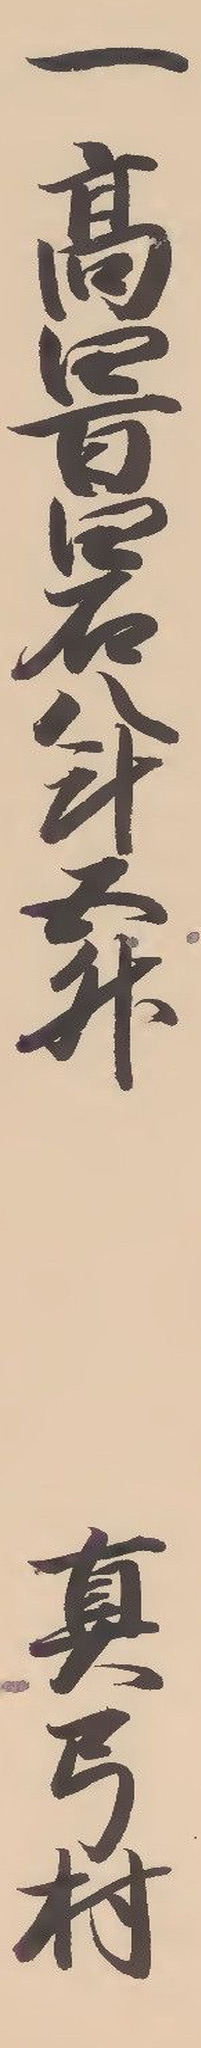一高四百四石八斗五升真弓村

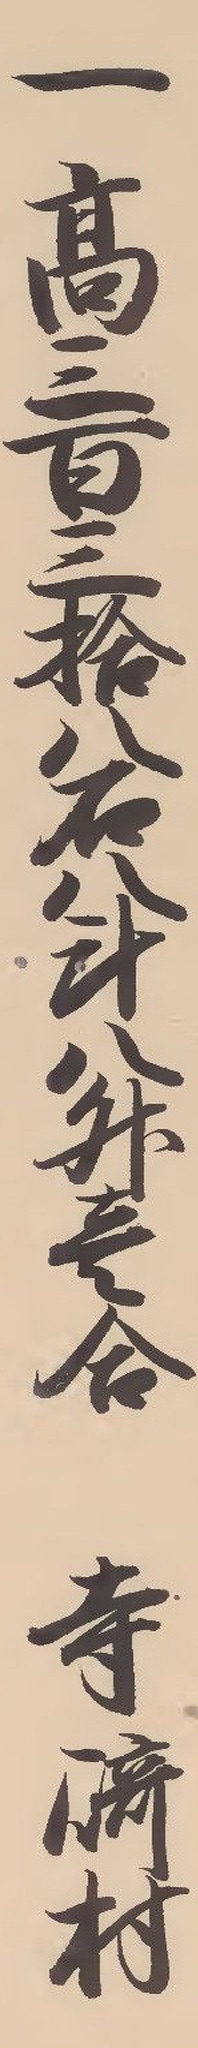一高三百三拾八石八斗八升壱合寺崎村
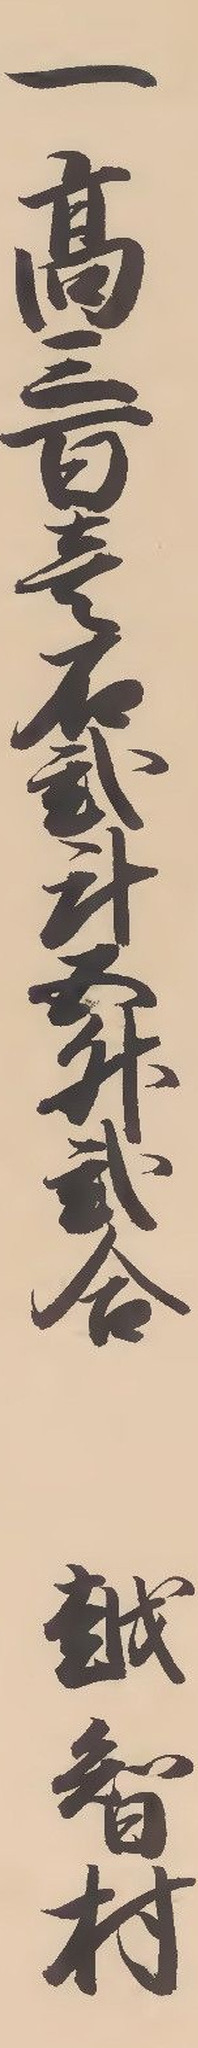一高三百壱石弐斗五升弐合越智村
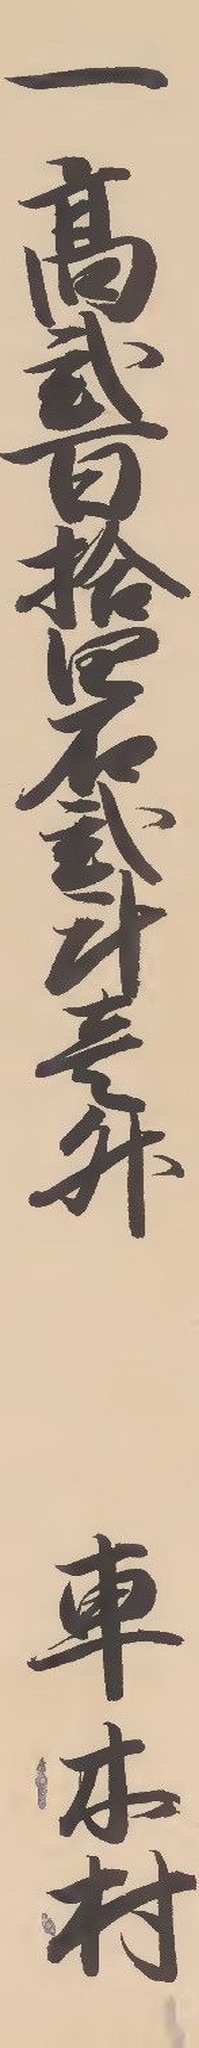一高弐百拾四石弐斗壱升車木村
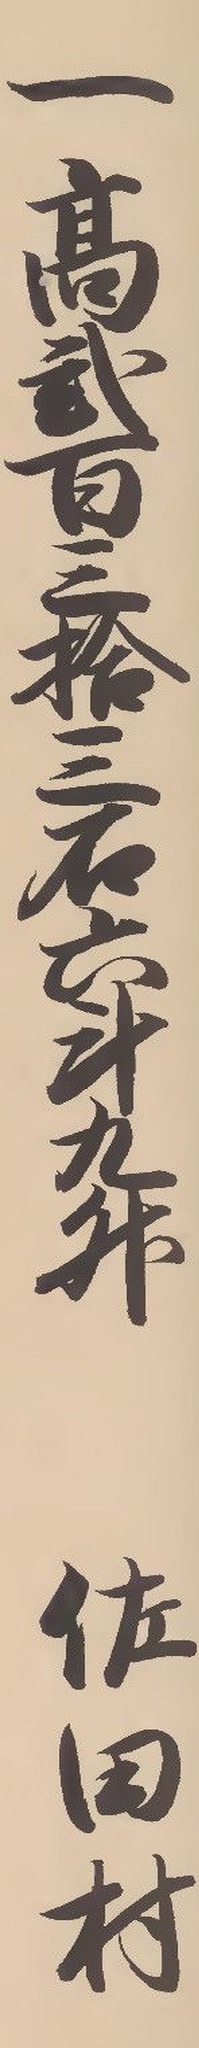一高弐百三拾三石六斗九升佐田村
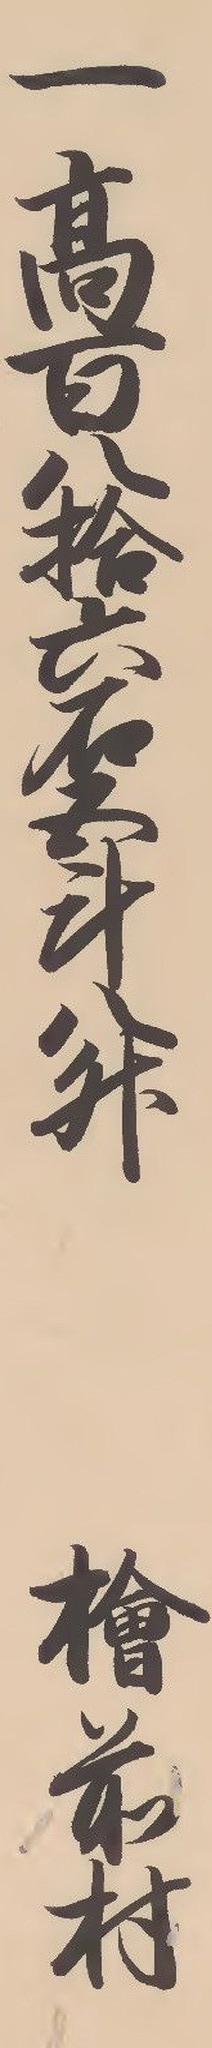一高百八拾六石五斗八升桧前村
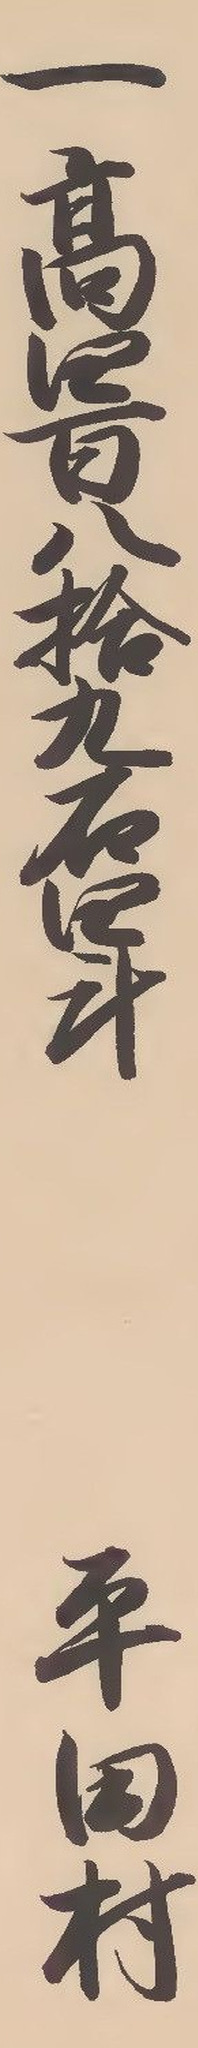一高四百八拾九石四斗平田村
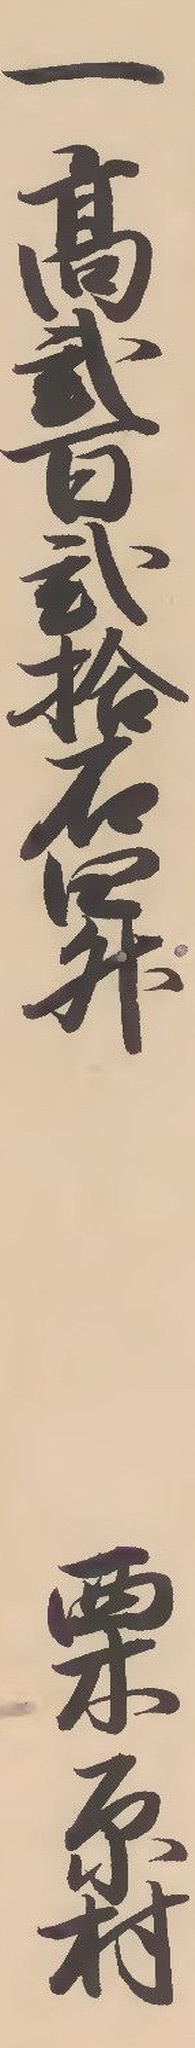一高弐百弐拾石四升栗原村

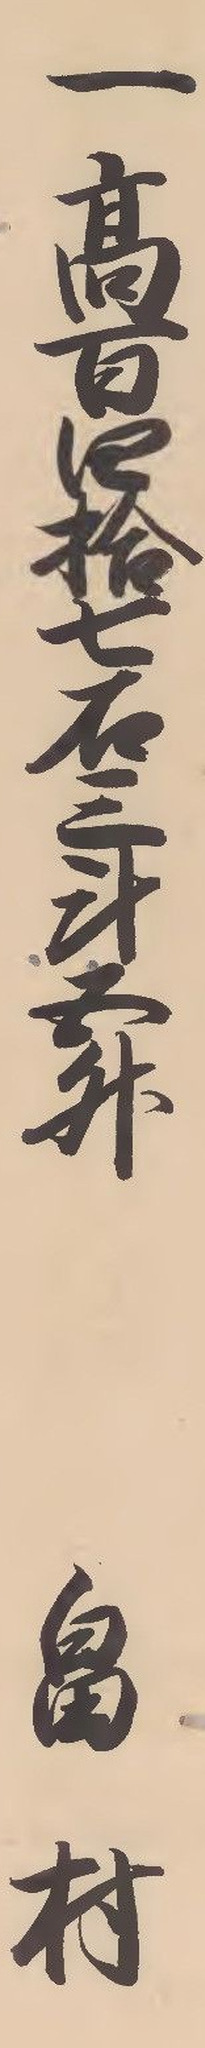一高百四拾七石三斗五升畠村
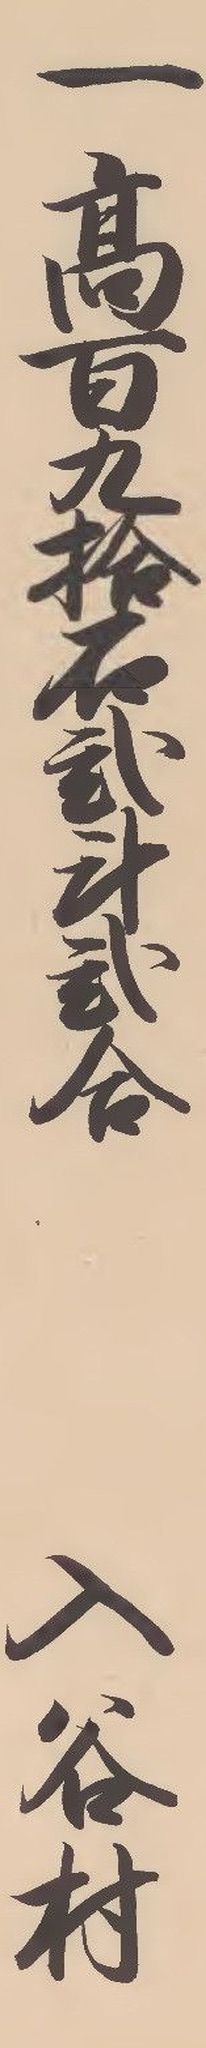一高百九拾石弐斗弐合入谷村
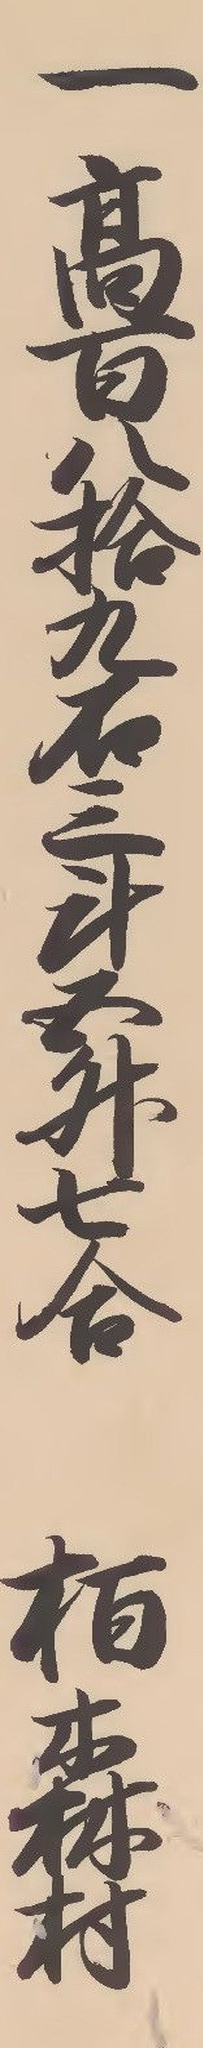一高百八拾九石三斗五升七合栢森村
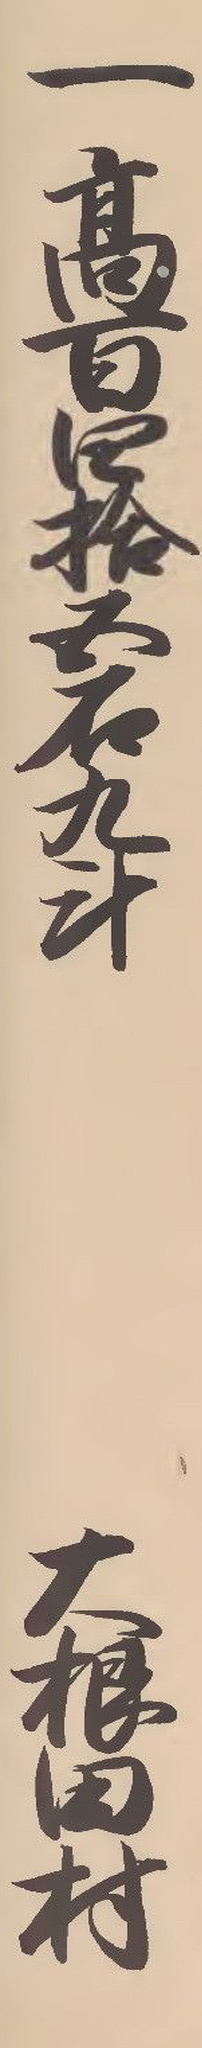一高百四拾五石九斗大根田村
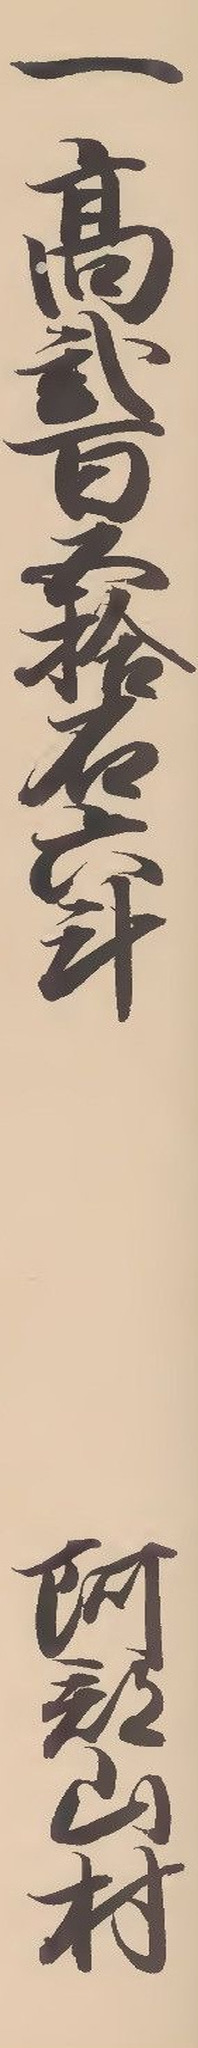一高弐百五拾石六斗阿部山村
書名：大和国郷帳
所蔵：国立公文書館 National Archives of Japan
